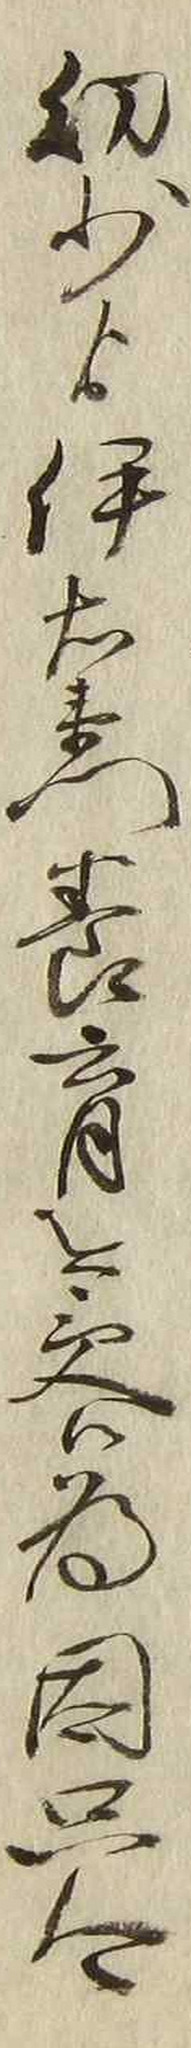幼少ゟ伊右衛門養育を受候為因只今
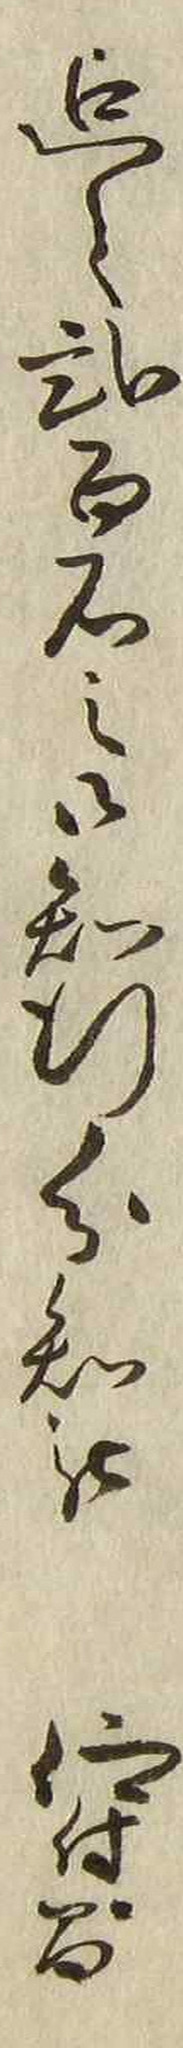迄之弐百石之御知行分知被仰付間
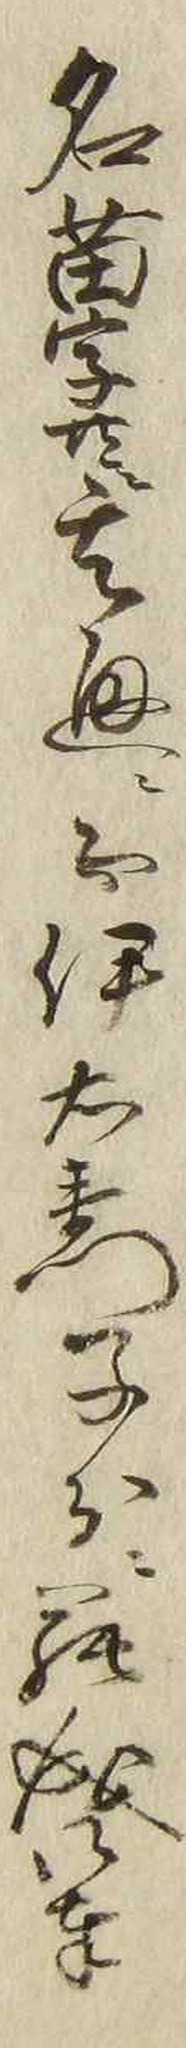名苗字共ニ其通ニ而伊右衛門子分ニ罷成御奉

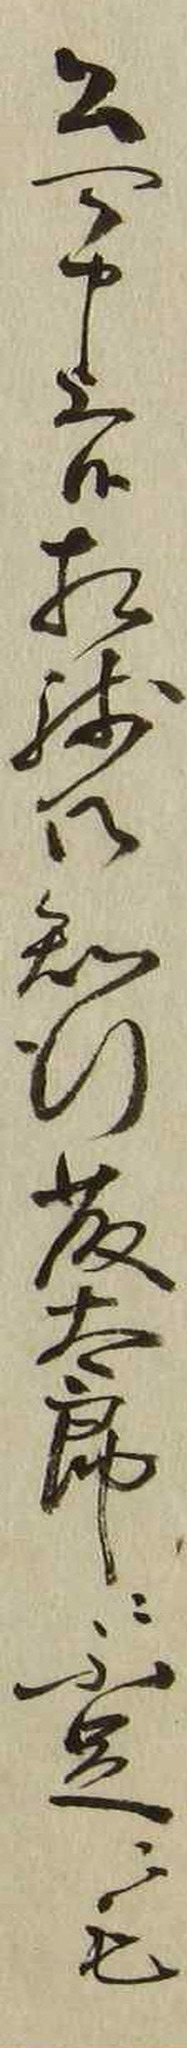公可申上候相残御知行藤太郎ニ不足ニも
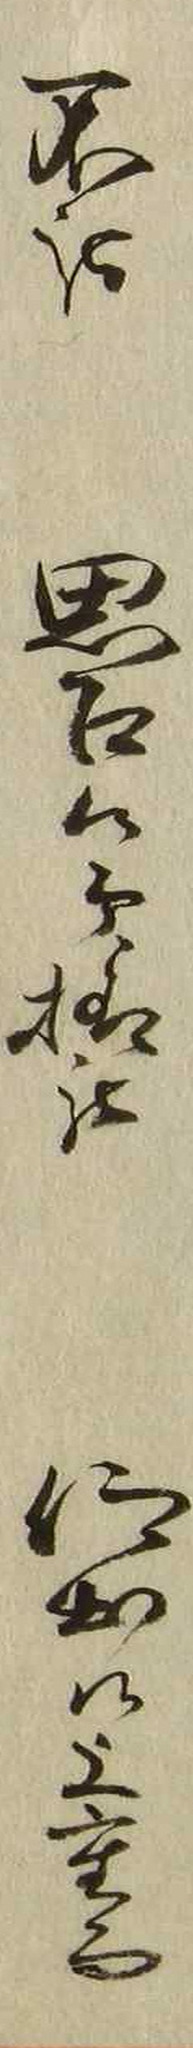不被思召候而様被仰出候上重而
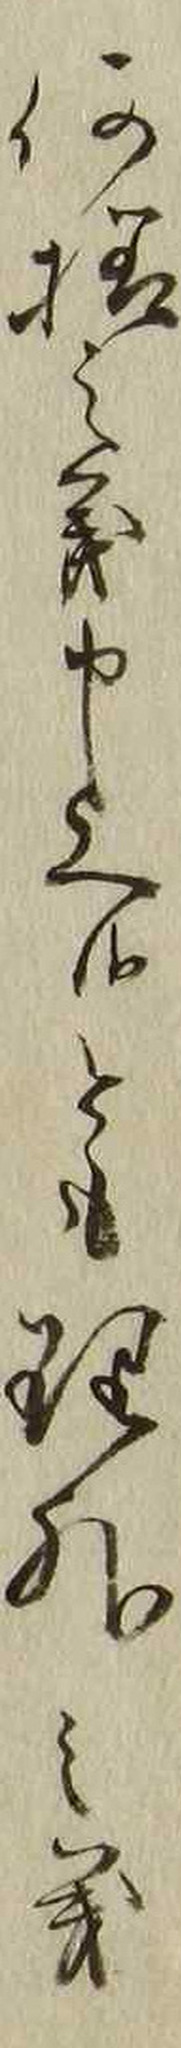何様之義申上候とも理外之義
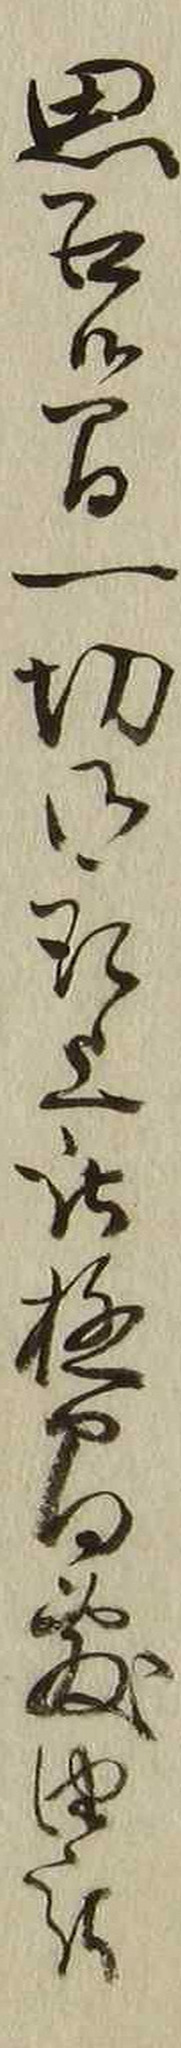思召候間一切御取上被遊間敷由被
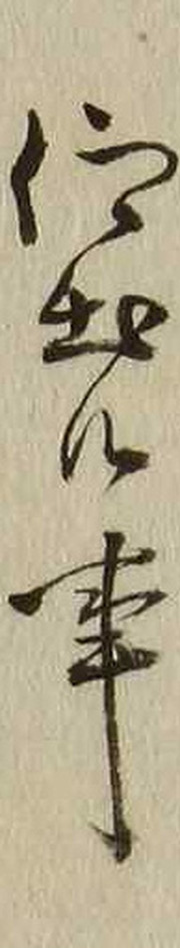仰出候事
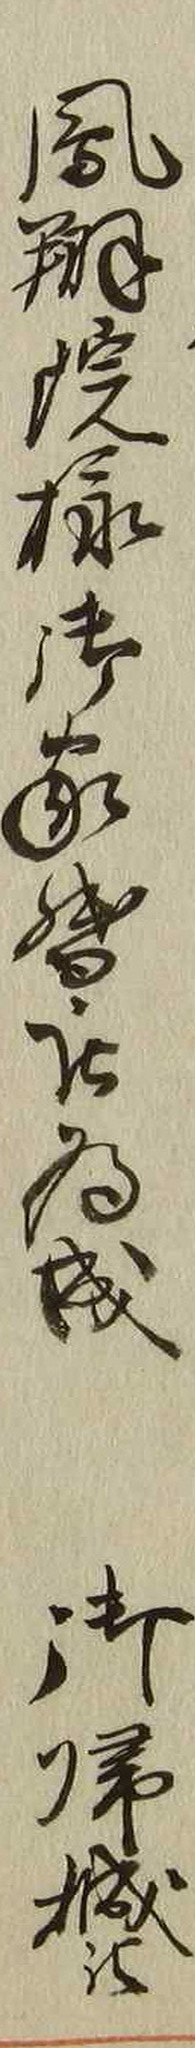鳳翔院様御家替被為成御帰城被
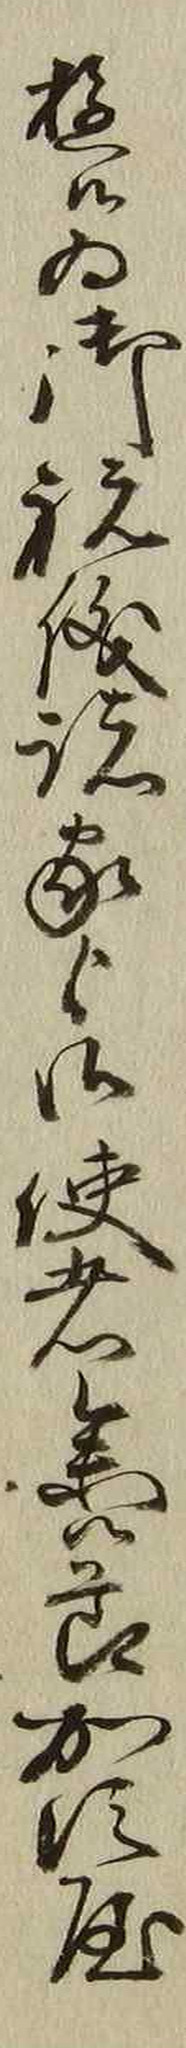遊候為御祝儀諸家ゟ御使者参候節加須屋
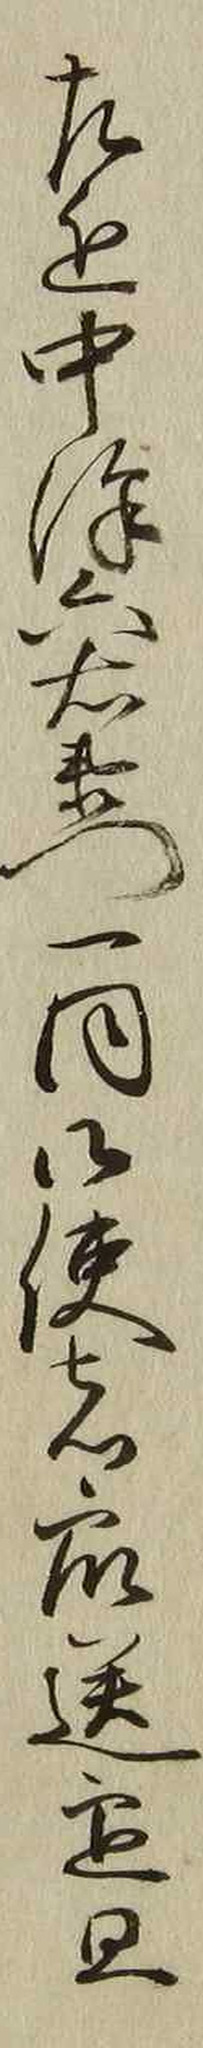左近中沢六右衛門一同御使者衆送迎且
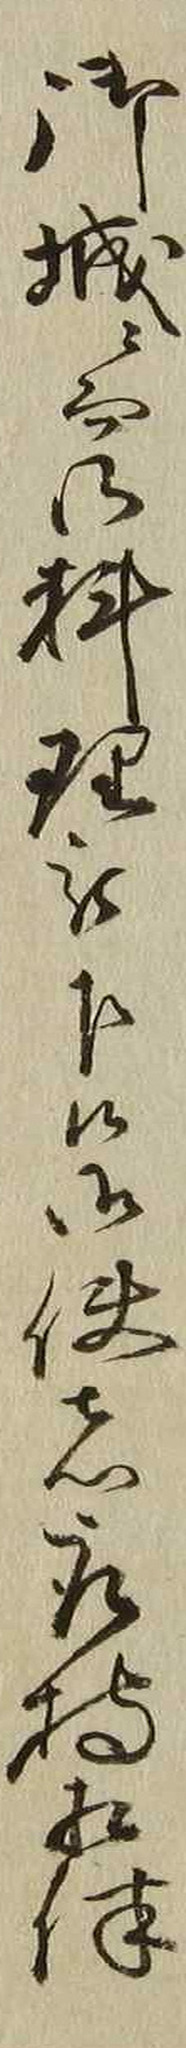御城ニ而料理被下候御使者取持相伴
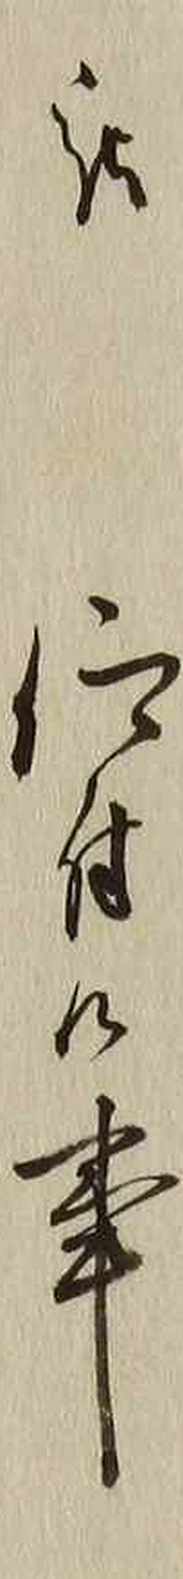被仰付候事
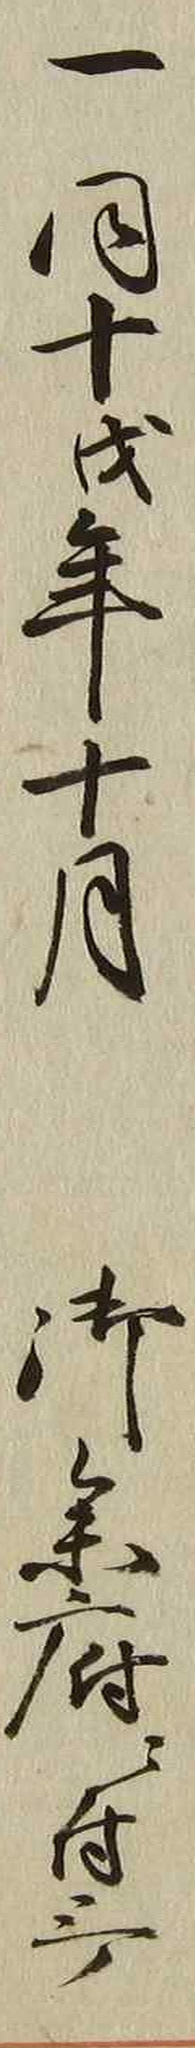一同十戌年十月御参府ニ付三ノ
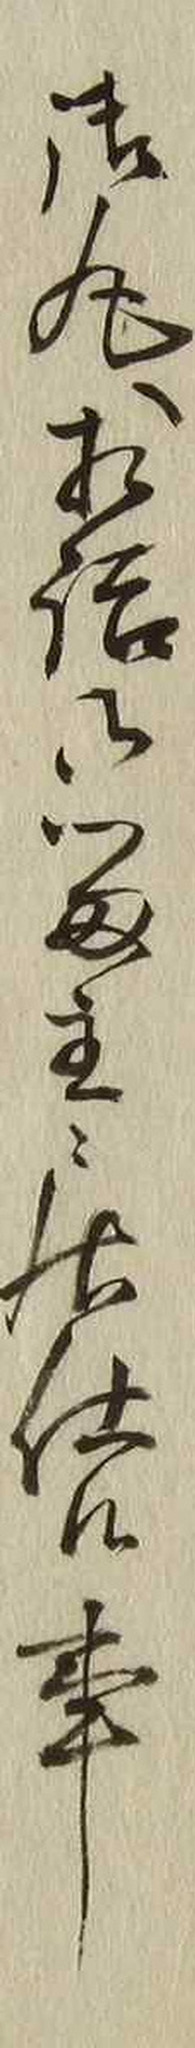御丸へ相詰御留主居仕候事
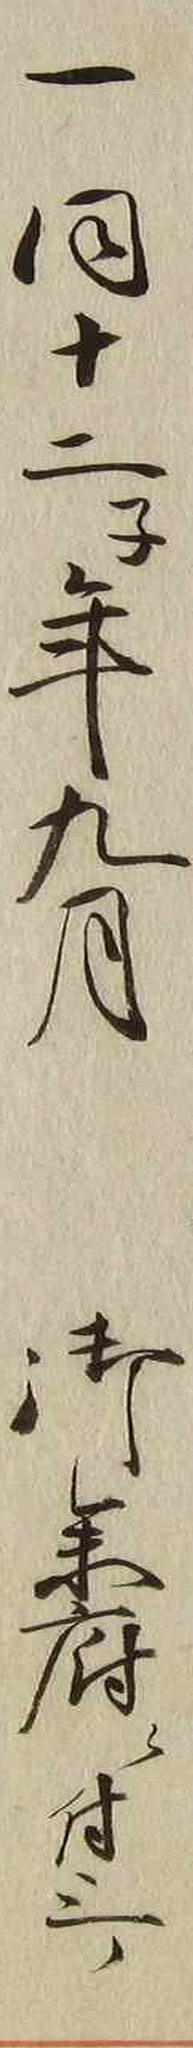一同十二子年九月御来府ニ付三ノ
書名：諸士系譜　巻之60　と之部3
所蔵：会津若松市立会津図書館
